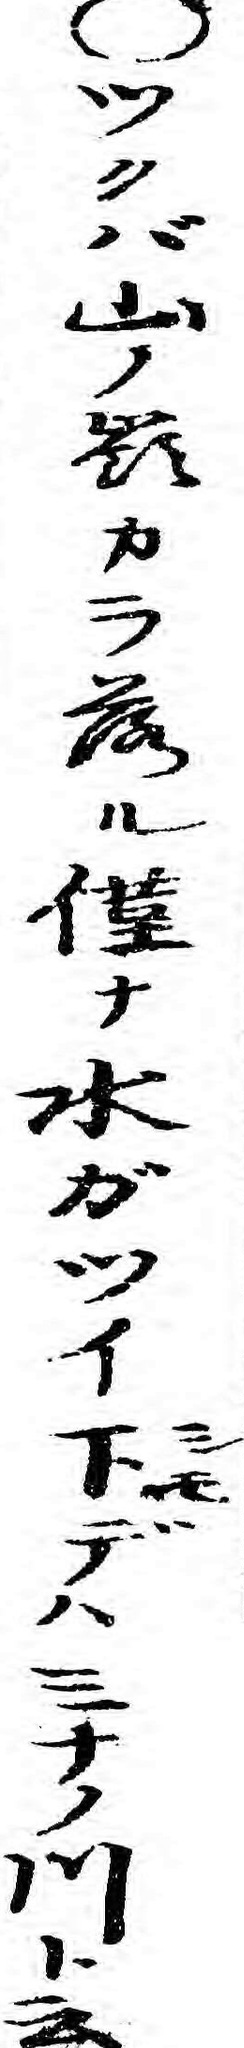○ツクバ山ノ嶺カラ落ル僅ナ水ガツイ下デハミナノ川と云
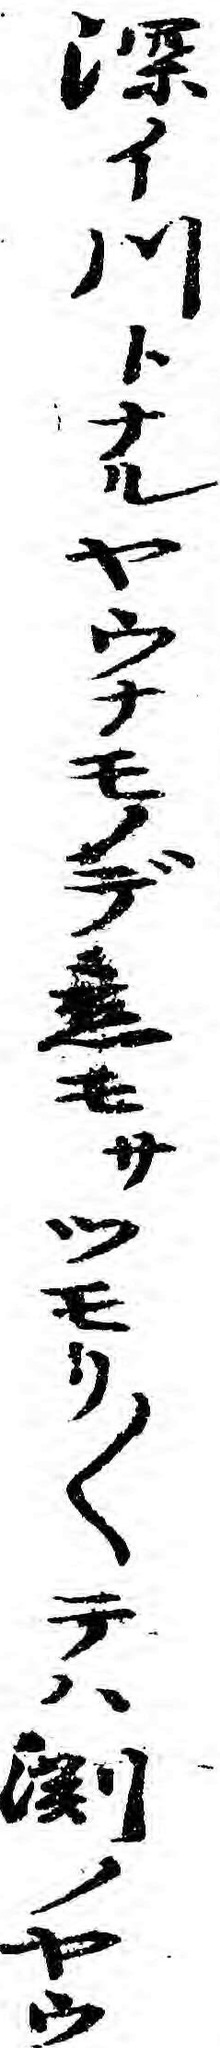深イ川トナルヤウナモノデ恋モツモリ〳〵テハ渕ノヤウ
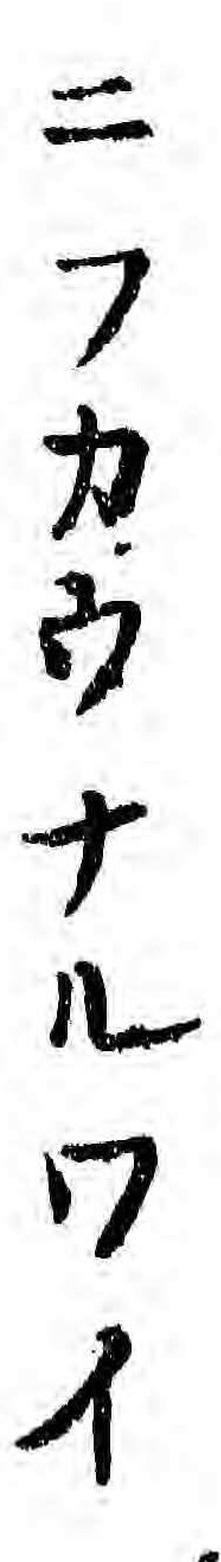ニフカウナルワイ
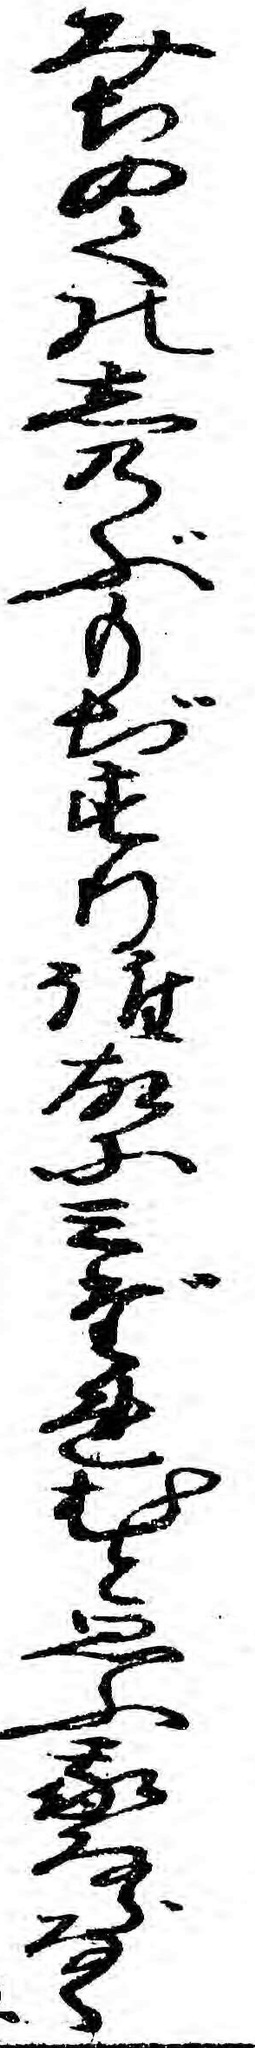みちのくのしのぶもぢすり誰故にみだれむと思ふ我ならなくに
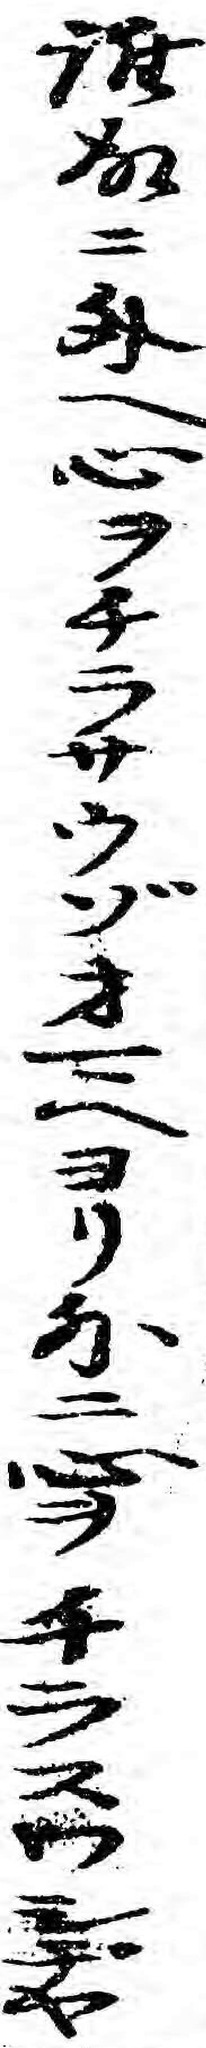○一二誰故ニ外ヘ心ヲチラサウゾオマヘヨリ外ニ心ヲチラスワシヂヤ
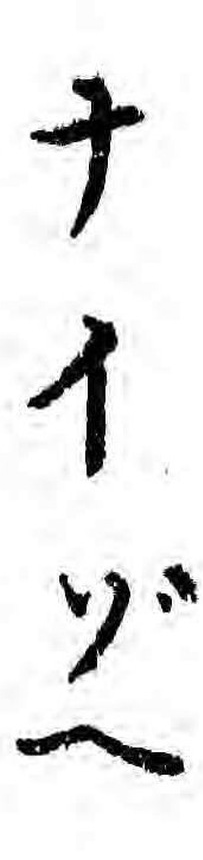ナイゾヘ

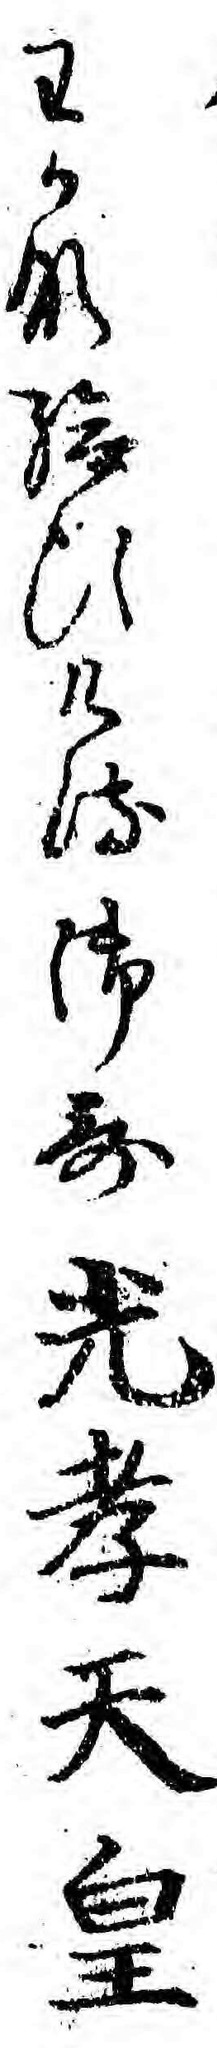わかな給ひける御哥光孝天皇
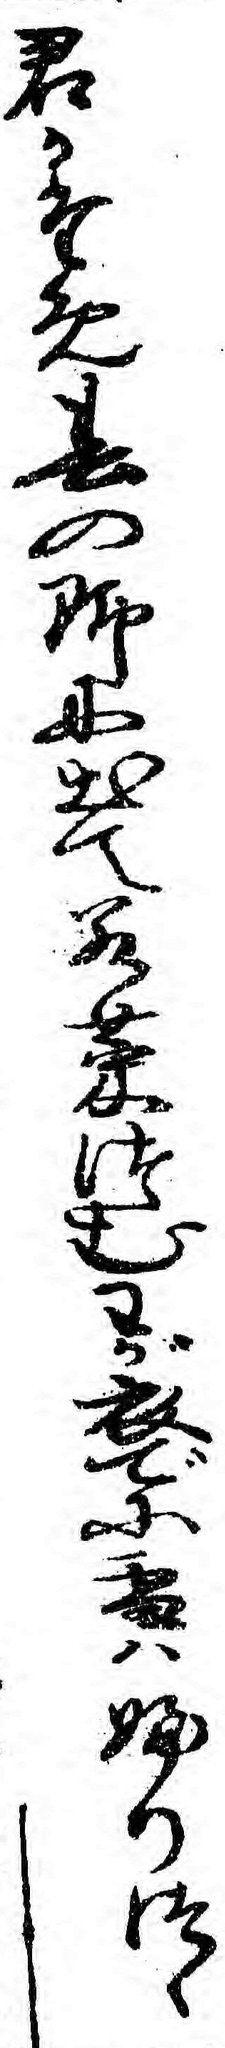君かため春の野に出て若菜つむわが衣でに雪はふりつゝ
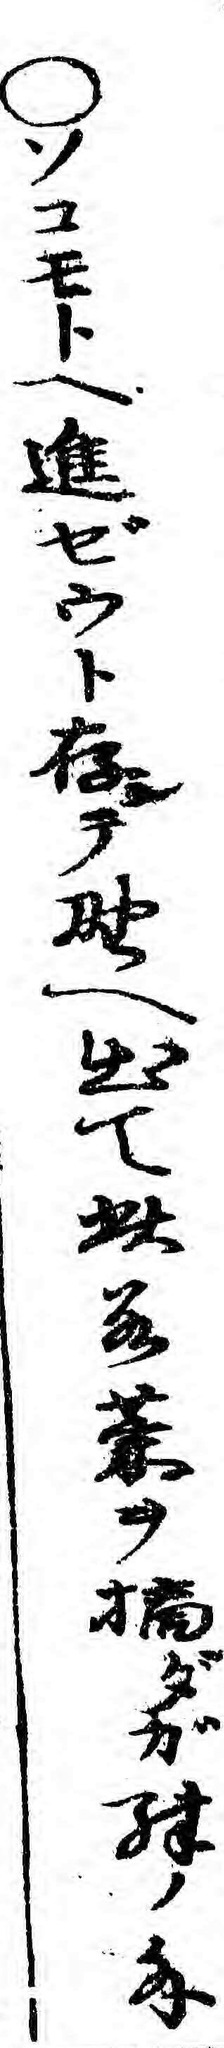○ソコモトヘ進ゼウト存シテ野へ出て此若菜ヲ摘ダガ殊ノ外
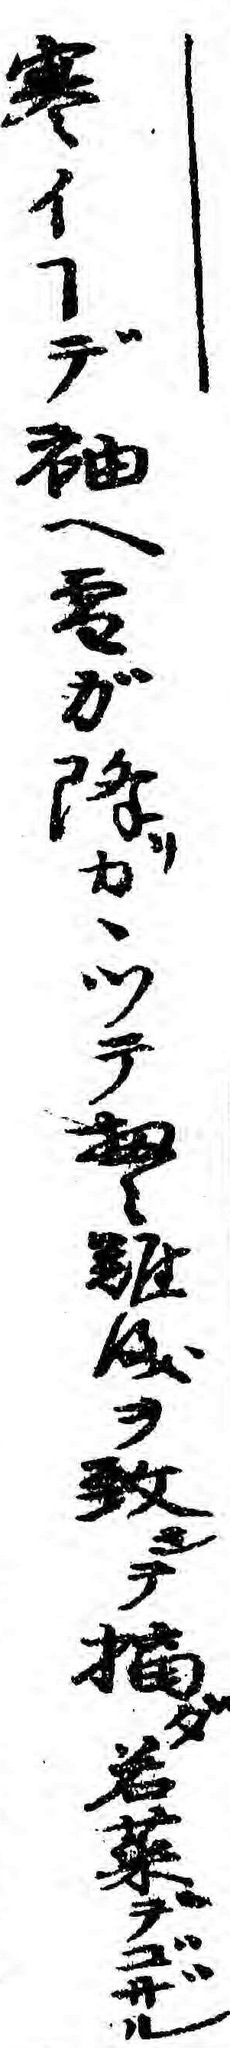寒イコトデ袖ヘ雪ガ降リカヽツテ扨々難成ヲ致シテ摘ダ若菜デゴザル
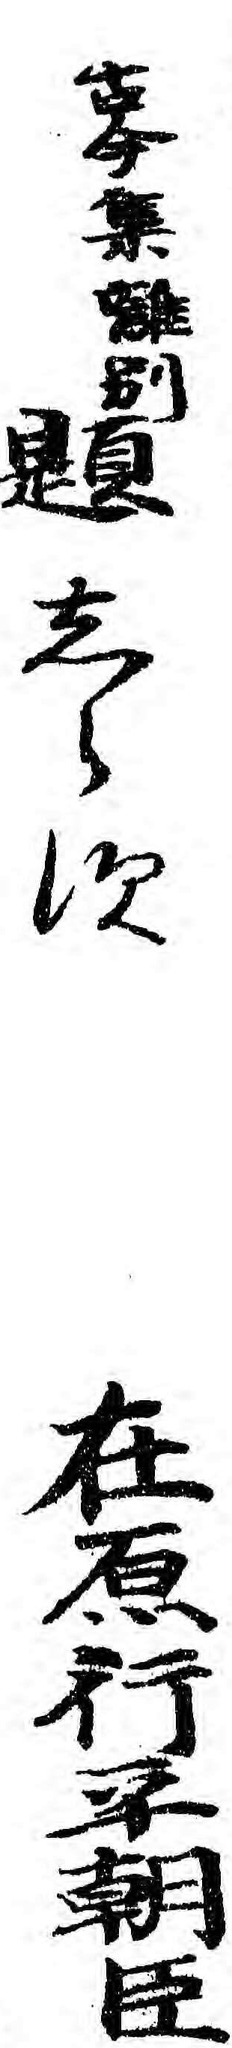古今集離別題しらず在原行平朝臣
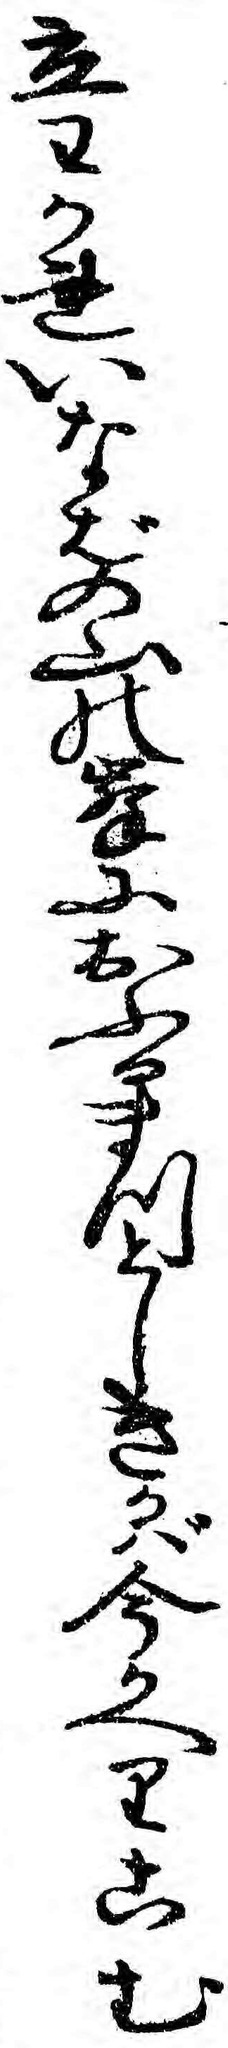立わかれいなばの山の峯におふるまつとしきかば今かへりこむ
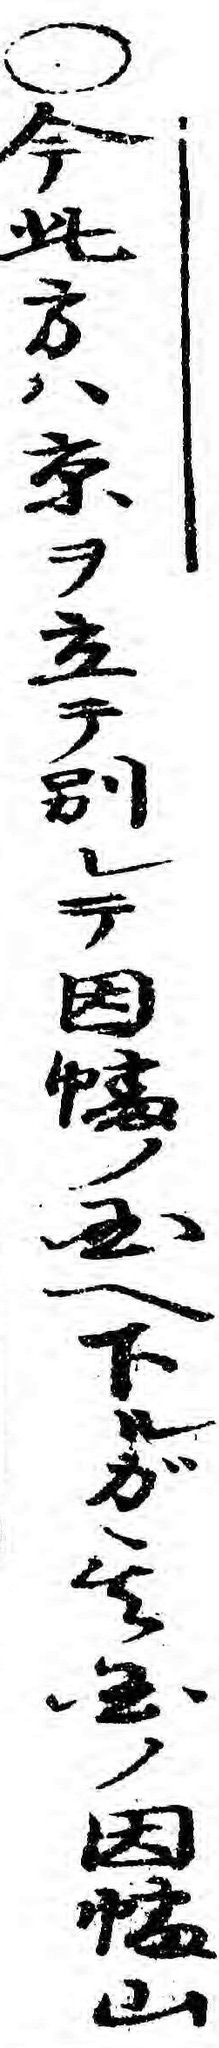○今此方ハ京ヲ立テ別レテ因幡ノ国ヘ下ルガ其国ノ因幡山
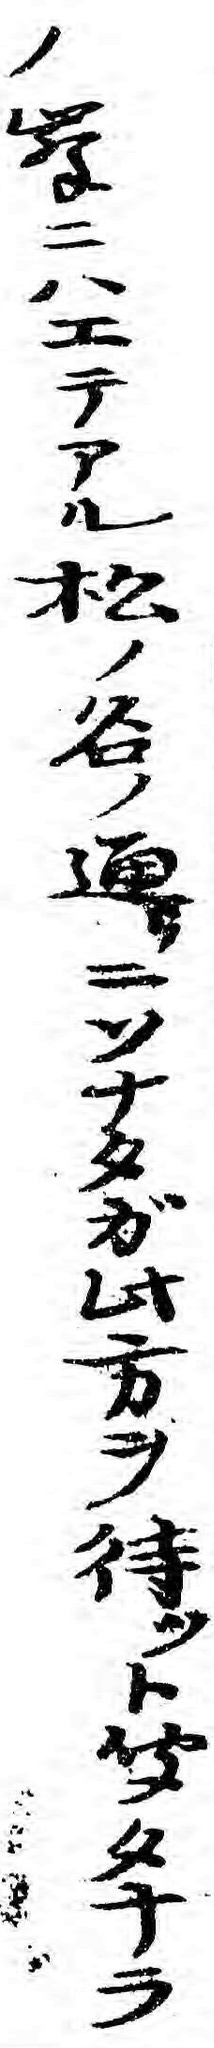ノ峯ニハエテアル松ノ谷ノ通ニソナタガ此方ヲ待ツト聞タナラ
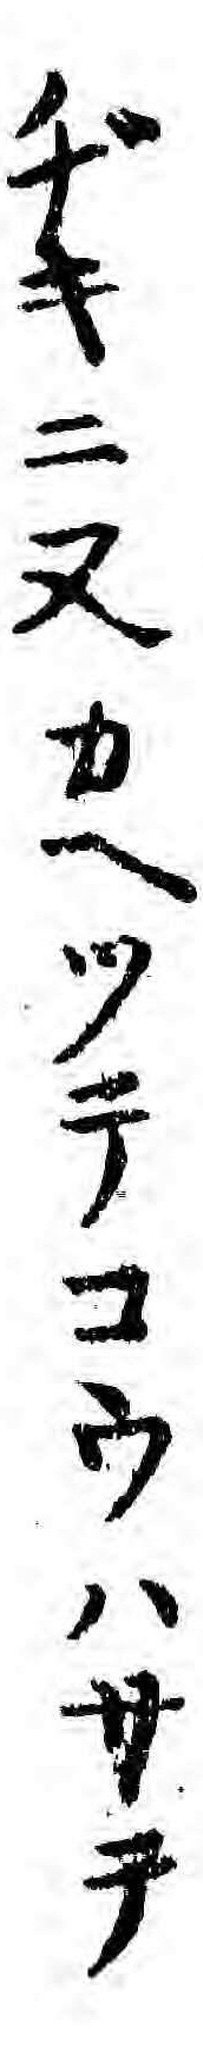ヂキニ又カヘツテコウハサテ
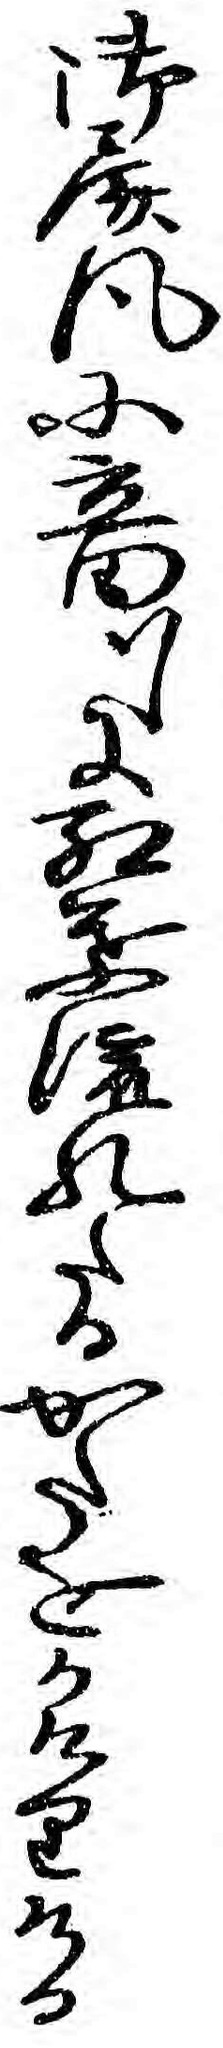御屏風に立田川に紅葉流れたるかたをかけりける
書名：百人一首／小倉の山ふみ
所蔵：国文学研究資料館
